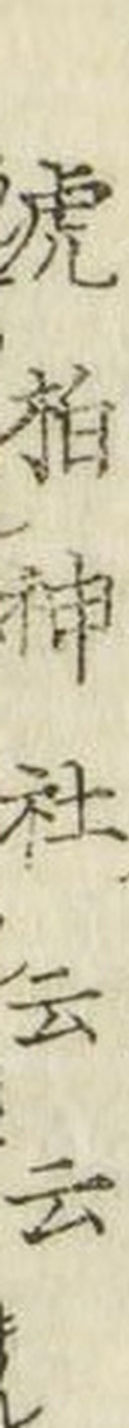虎柏神社云云
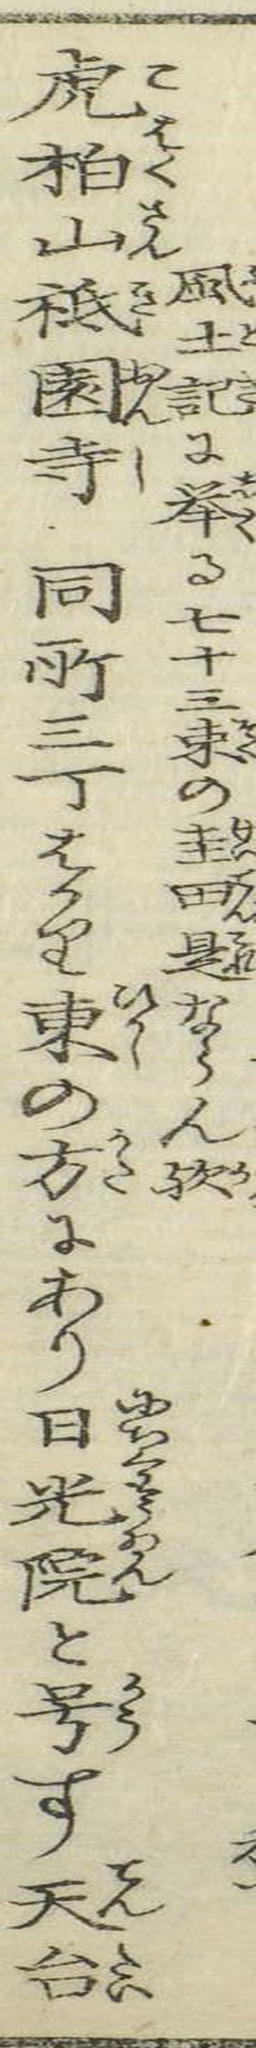虎柏山祗園寺同所三丁はかり東の方にあり日光院と号す天台
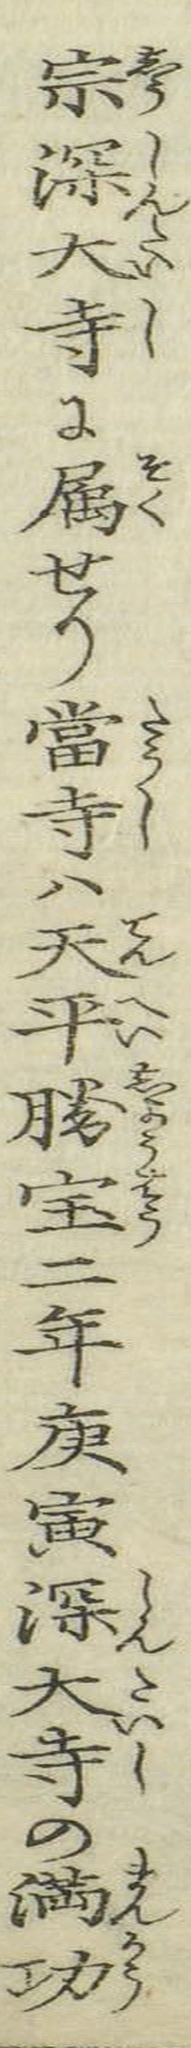宗深大寺に属せり当寺は天平勝宝二年庚寅深大寺の満功
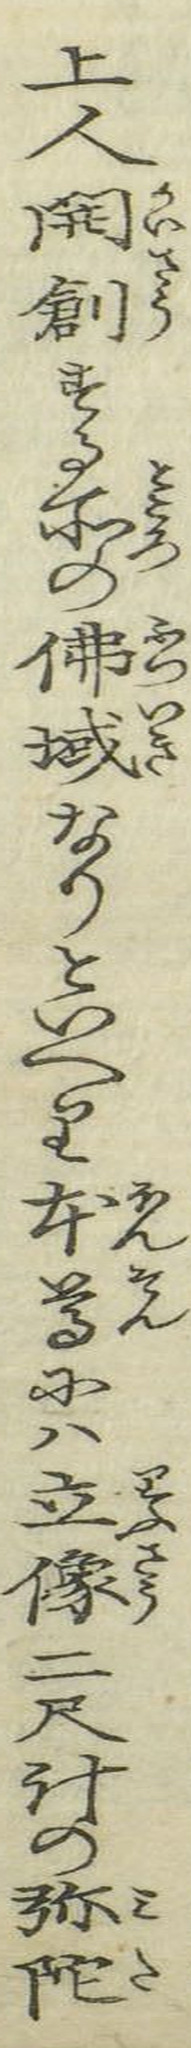上人開創する所の佛域なりといへり本尊には立像二尺計の弥陀

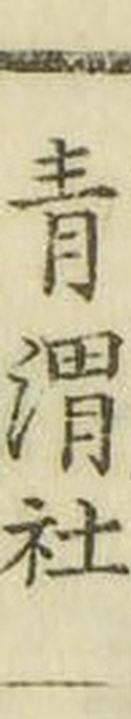青渭社
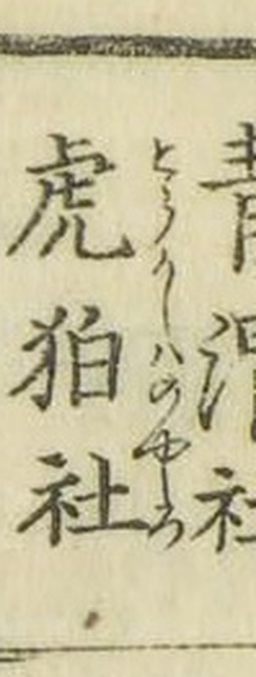虎狛社
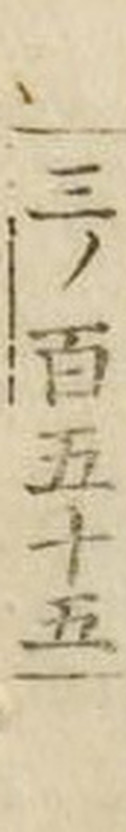三ノ百五十五
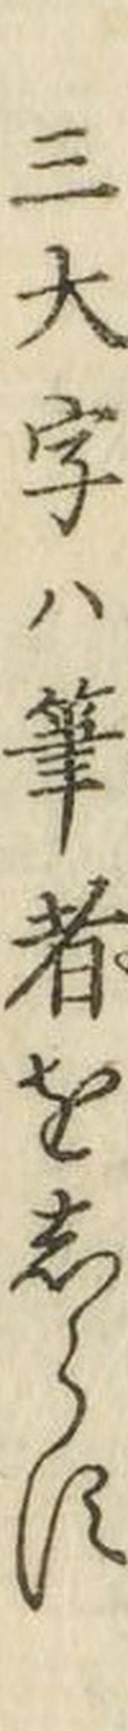三大字は筆者をしらす
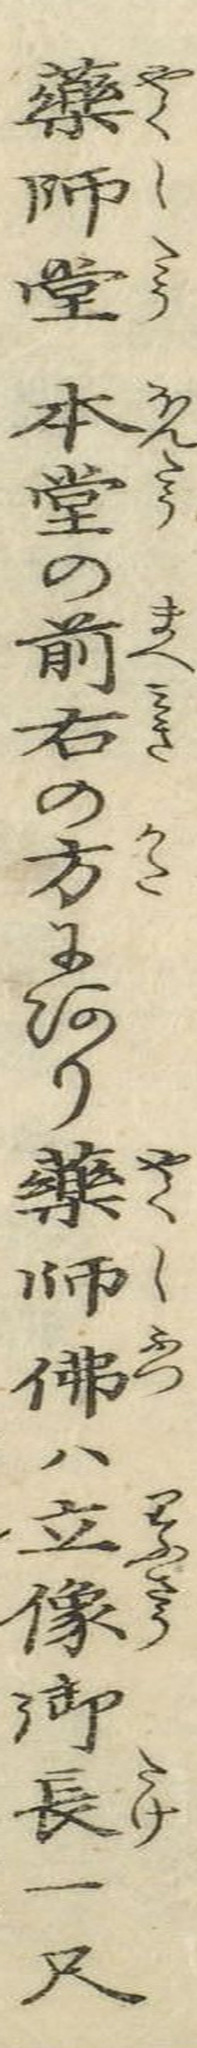薬師堂本堂の前右の方にあり薬師佛は立像御長一尺
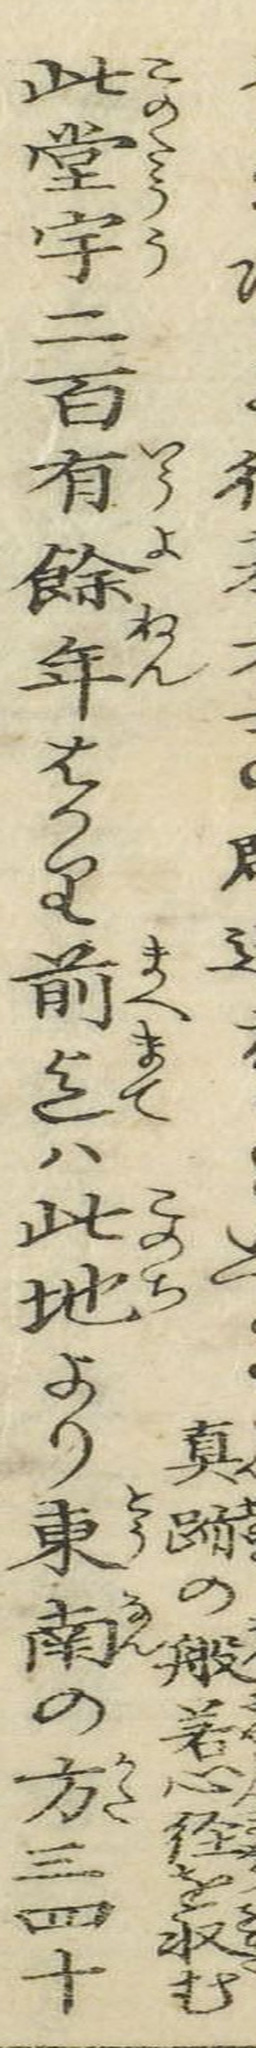此堂宇二百有余年はかり前迠は此地より東南の方三四十
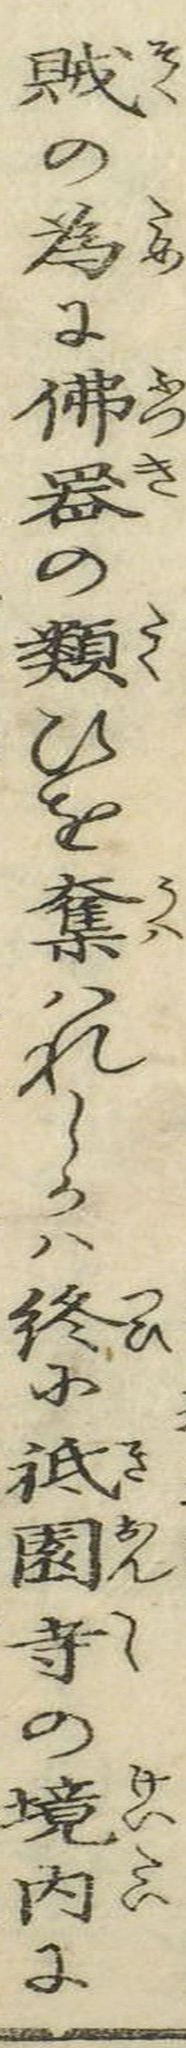賊の為に佛器の類ひを奪はれしかは終に祗園寺の境内に
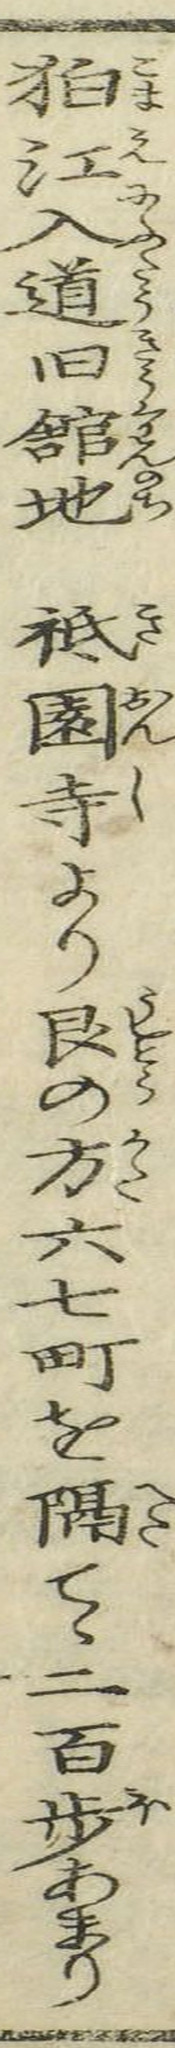狛江入道旧館地祗園寺より艮の方六七町を隔てゝ二百歩あまり
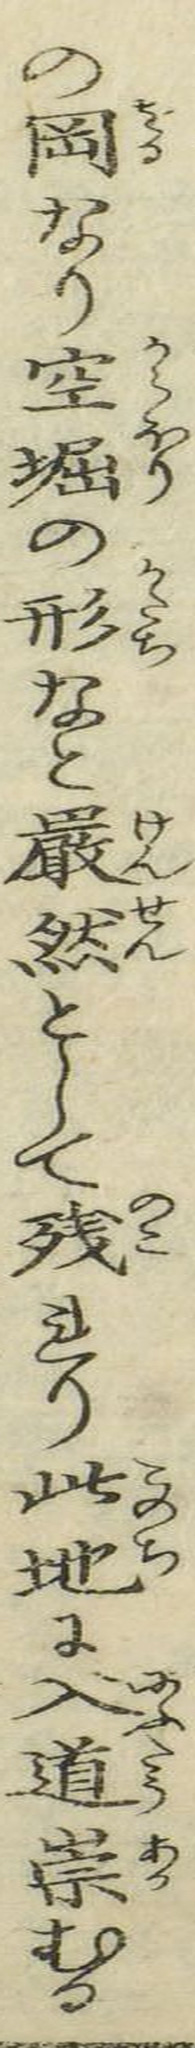の岡なり空堀の形なと厳然として残れり此地に入道崇むる
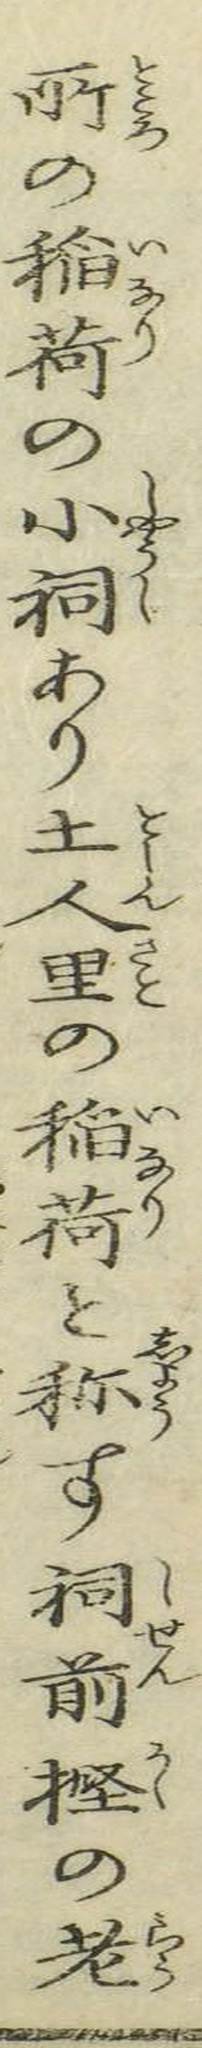所の稲荷の小祠あり土人里の稲荷と称す祠前樫の老
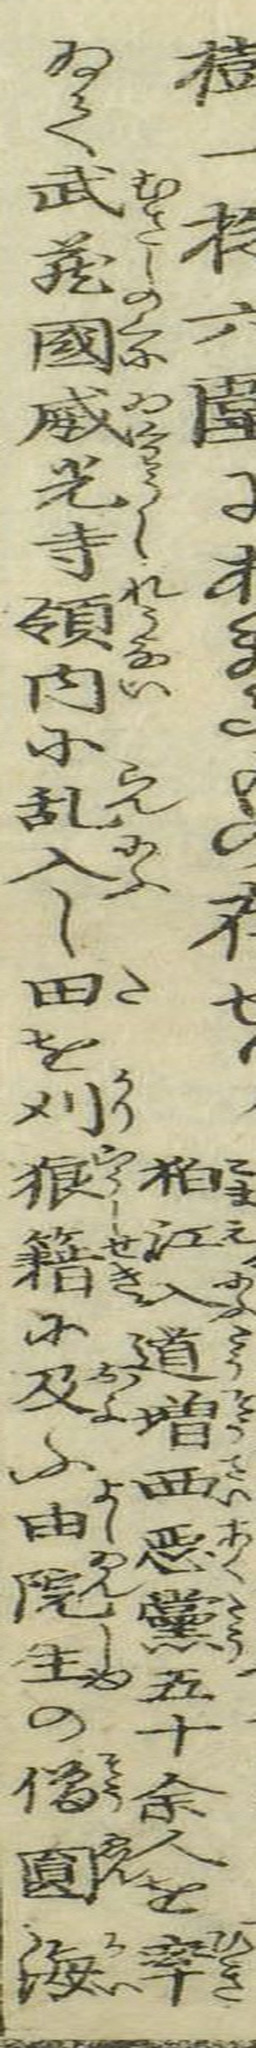ゐて武蔵国威光寺領内に乱入し田を刈狼籍に及ふ由院主の僧円海

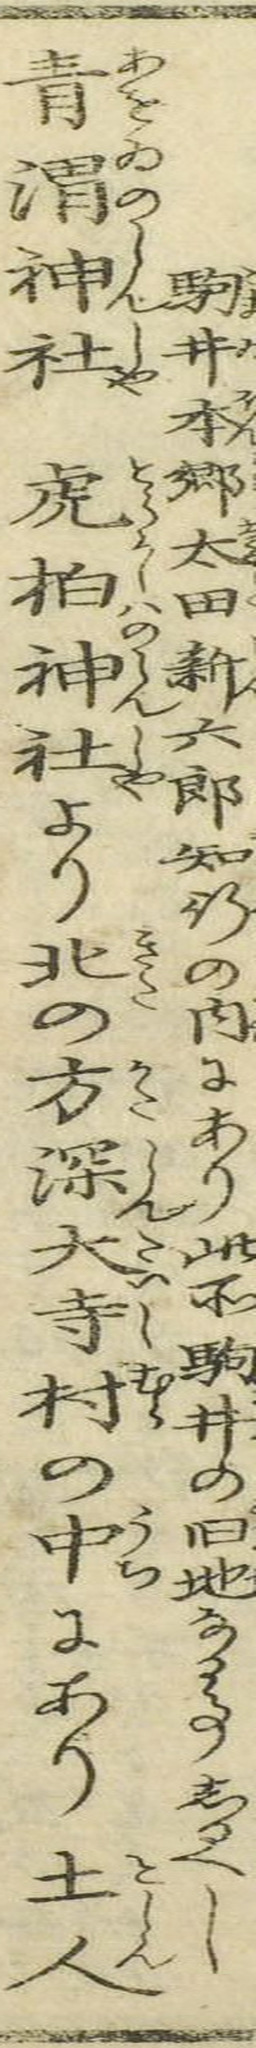青渭神社虎柏神社より北の方深大寺村の中にあり土人
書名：江戸名所図会 20巻 巻之9
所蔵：東京学芸大学教育コンテンツアーカイブ
